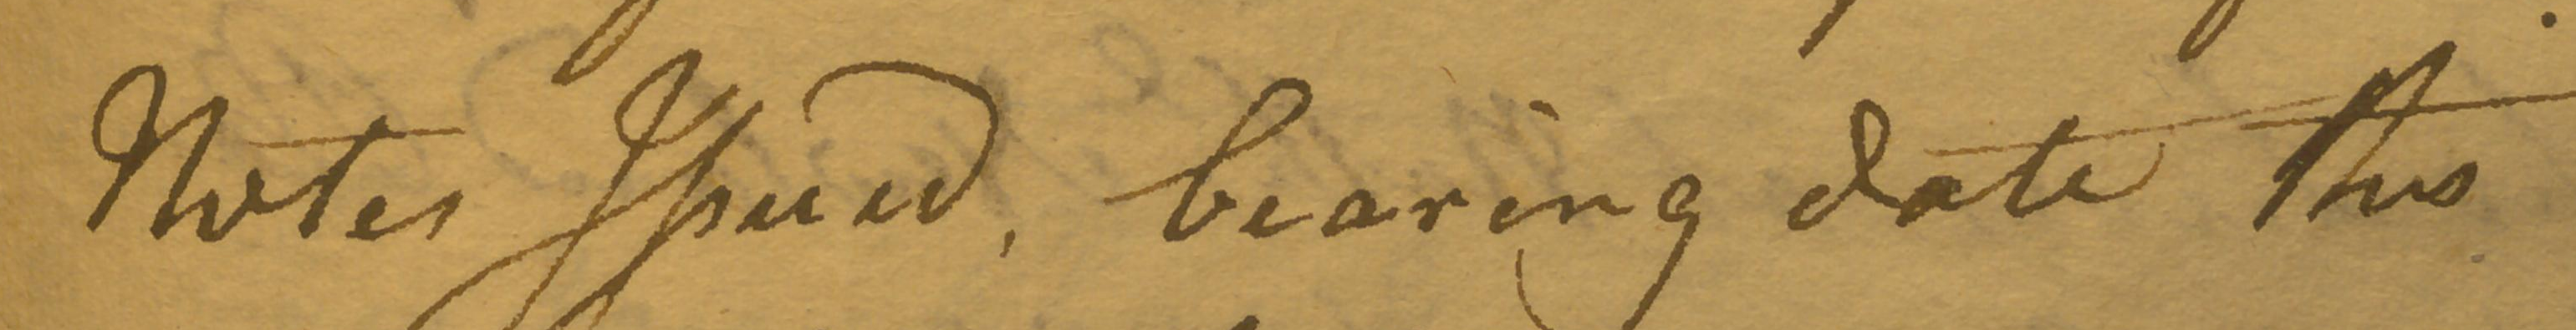Notes Issued. bearing date the
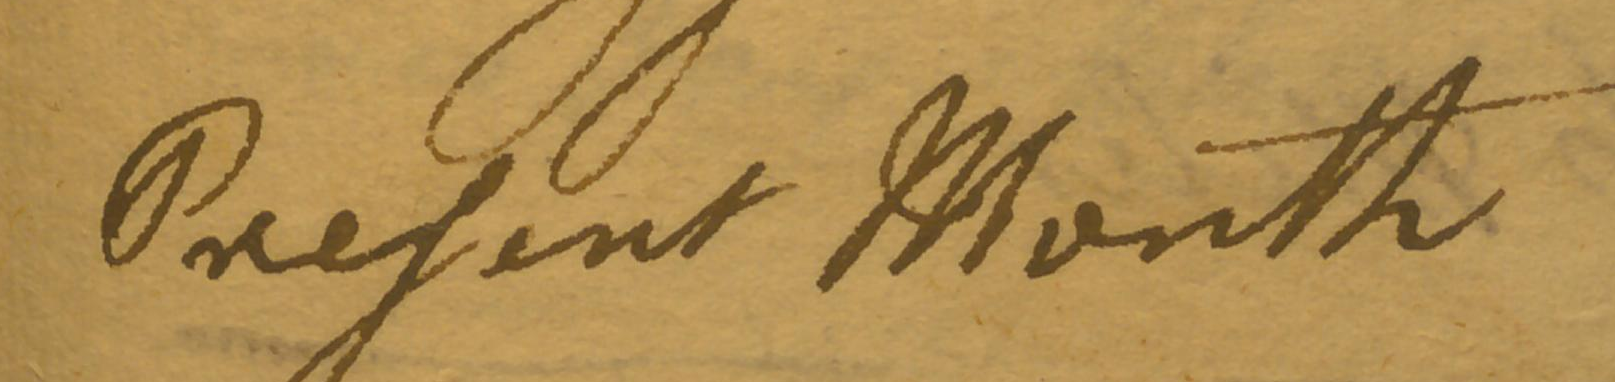Present Month
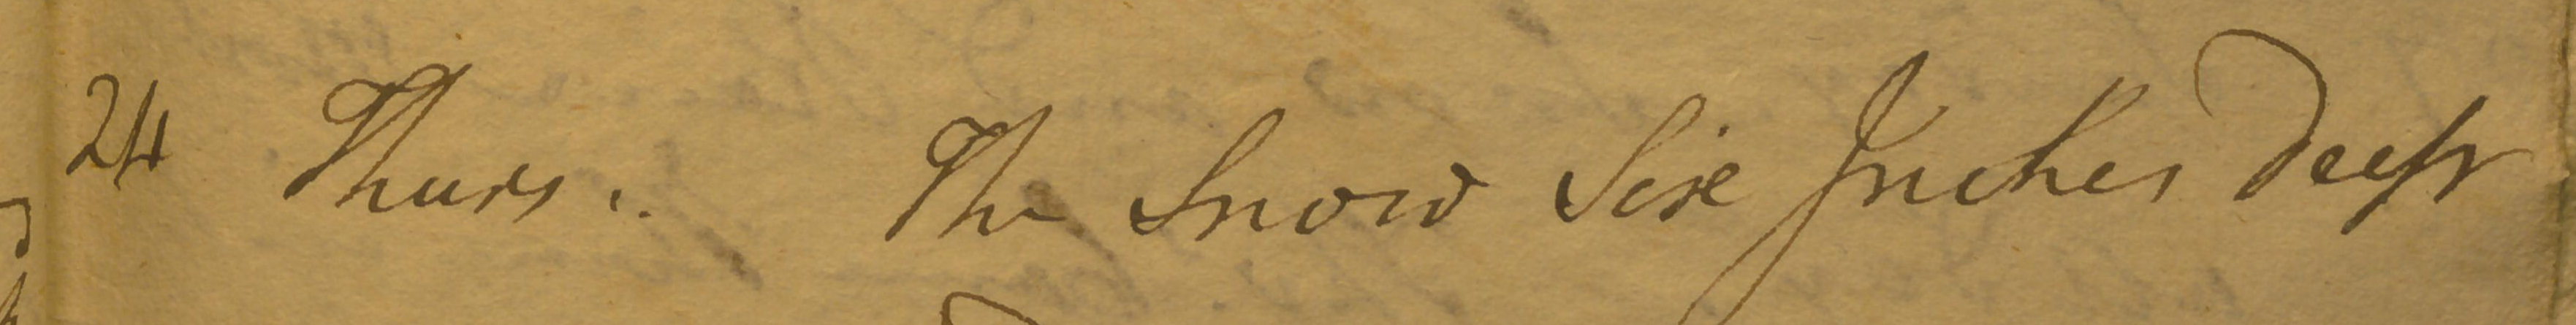24 Thurs. The Snow Six Inches deep
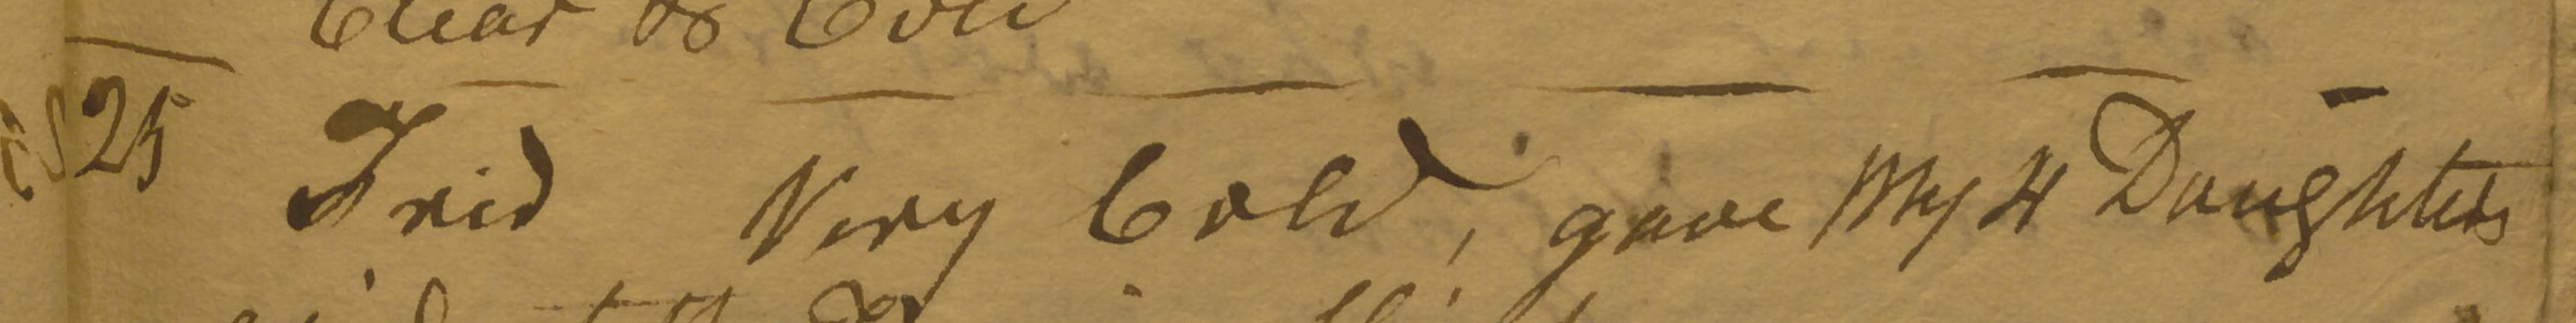25 Frid Very Cold, gave My 4 Daughters
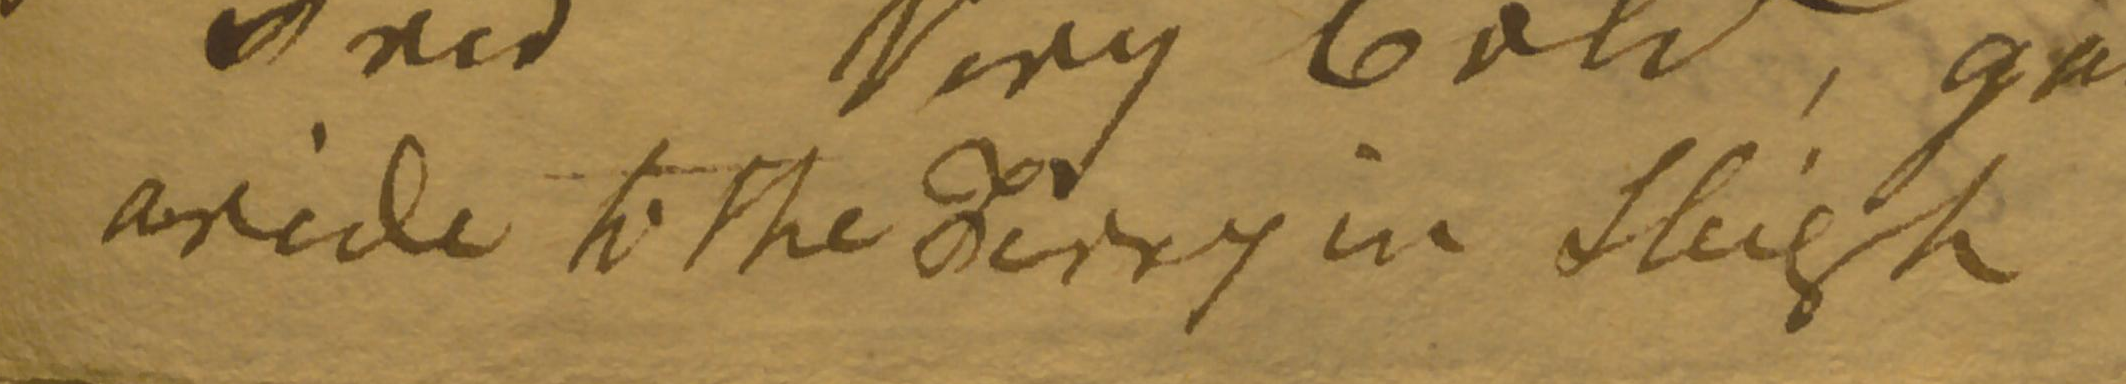a ride to the Ferry in Sleigh
